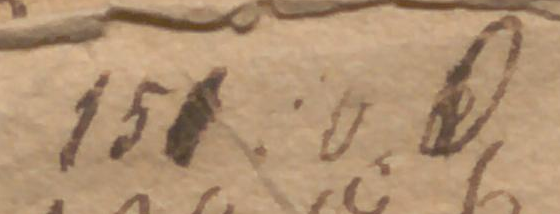151.0 0
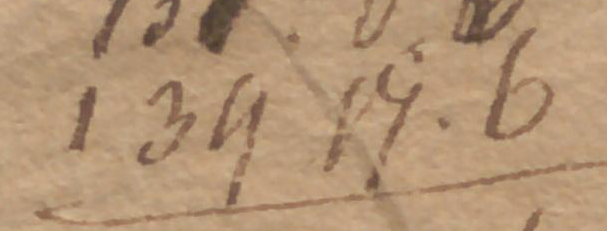139 17.6
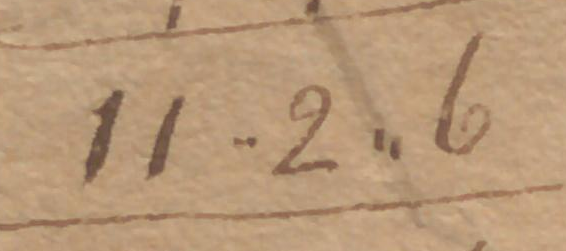11.2.6
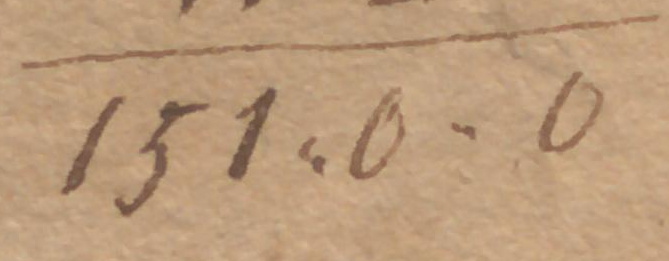151.0.0
